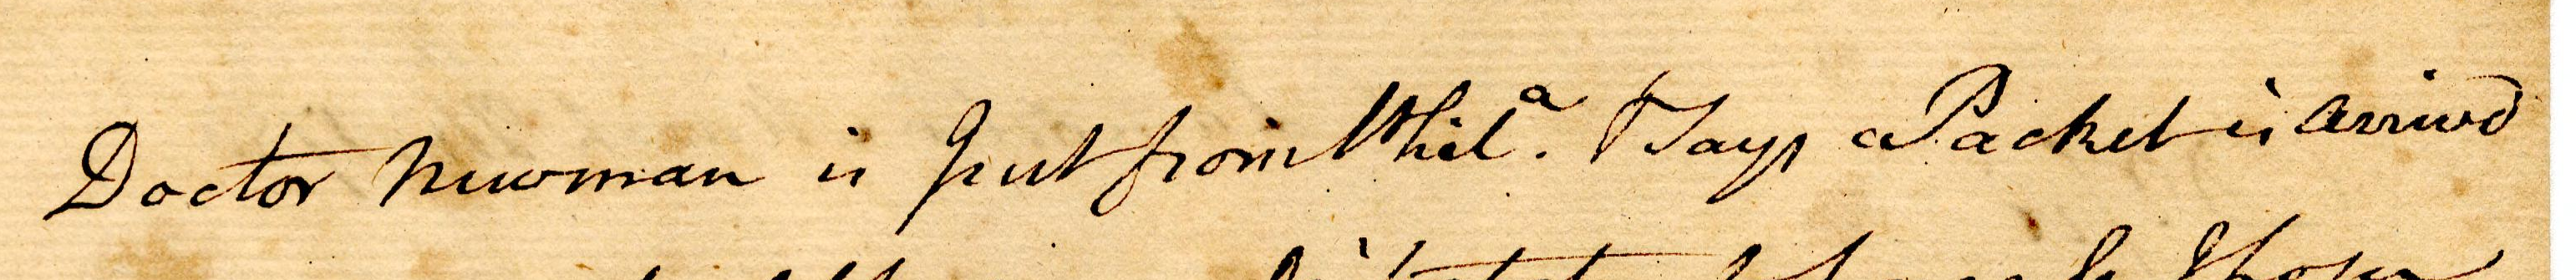Doctor Newman is just from Phil^a & says a Packet is arrived
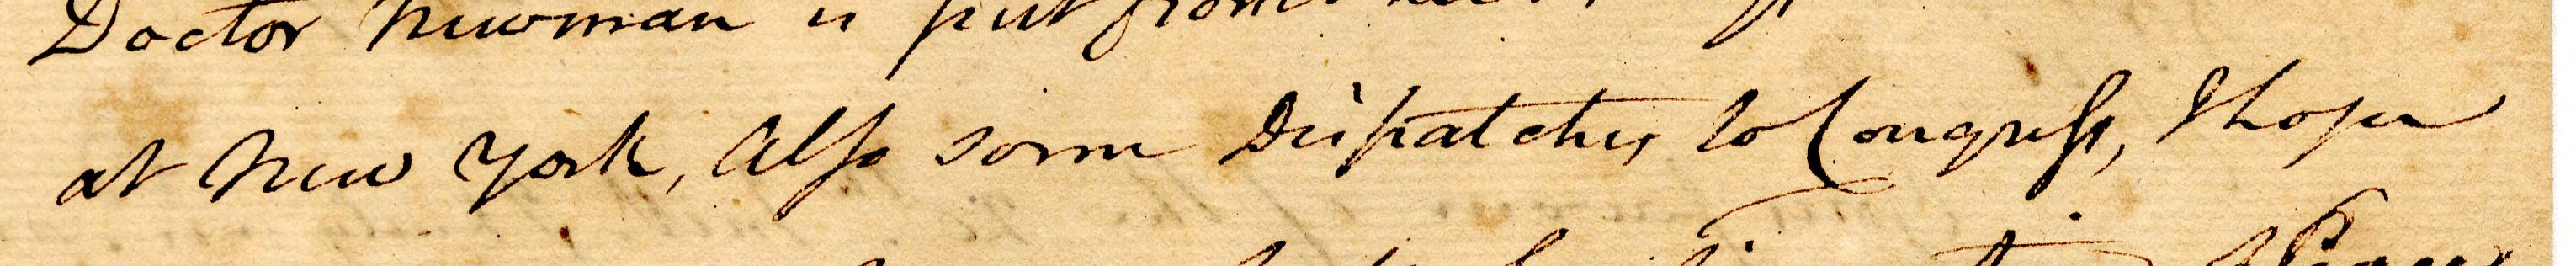at New York, Also some Dispatches to Congress, I hope
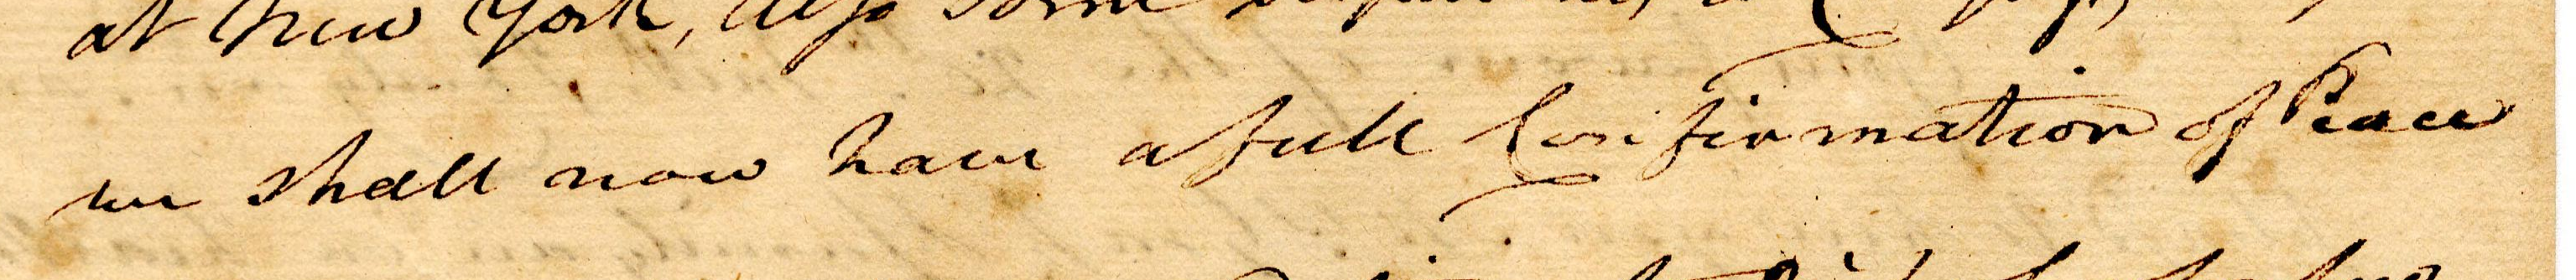we shall now have a full Confirmation of Peace
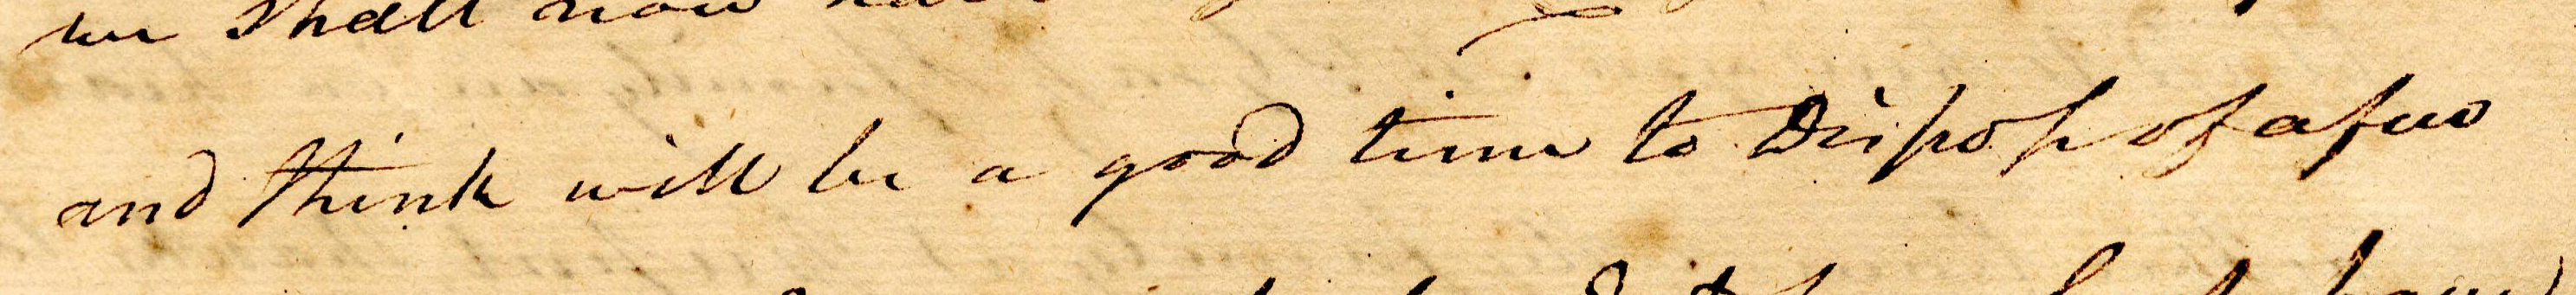and think will be a good time to Dispose of a few
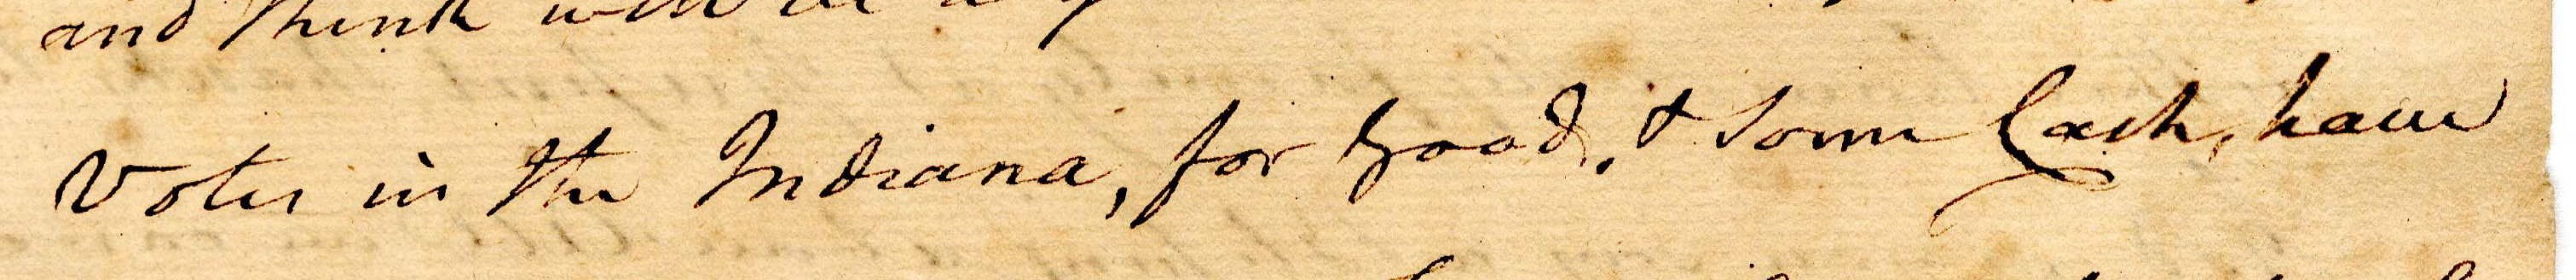votes in the Indiana, for Good & some Each, have
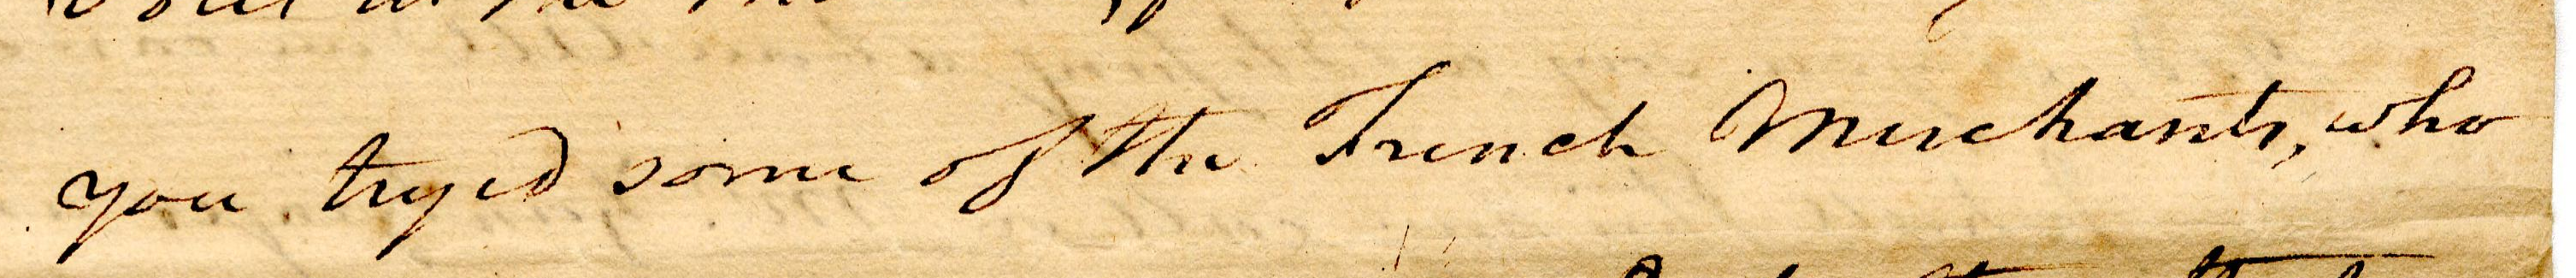you tryed some of the French Merchants, who
